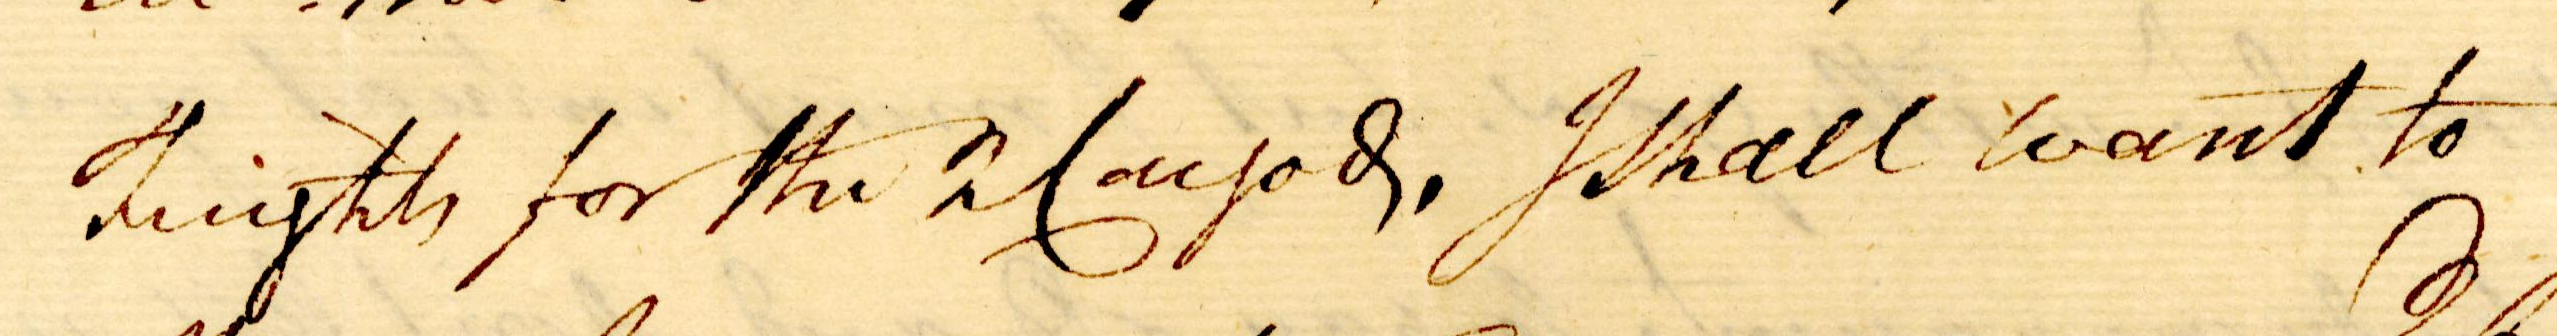Leights for the 2 Cause &, I shall want to
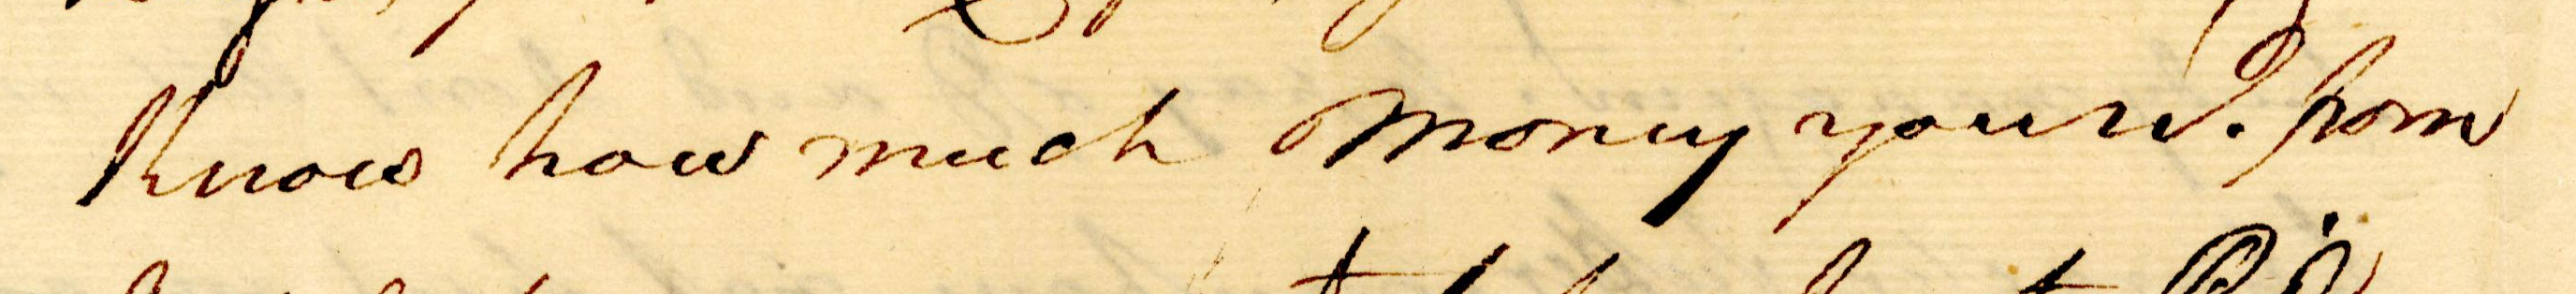Know how much money you re^d. from
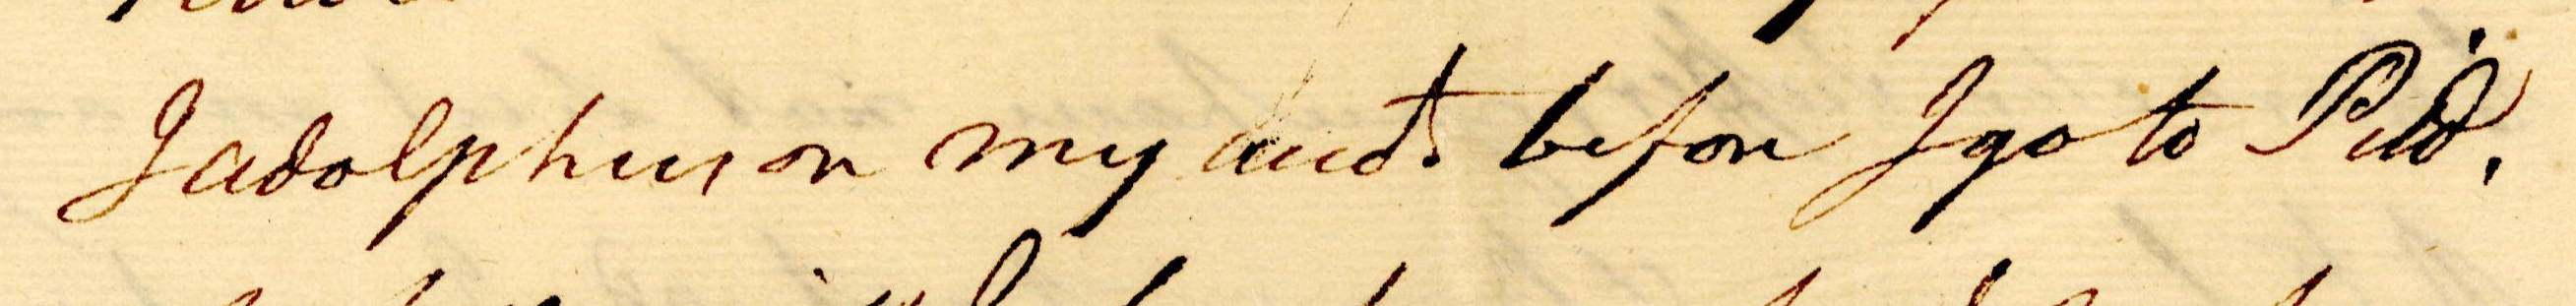G Adolphus on my acco^t. before I go to Pitd.
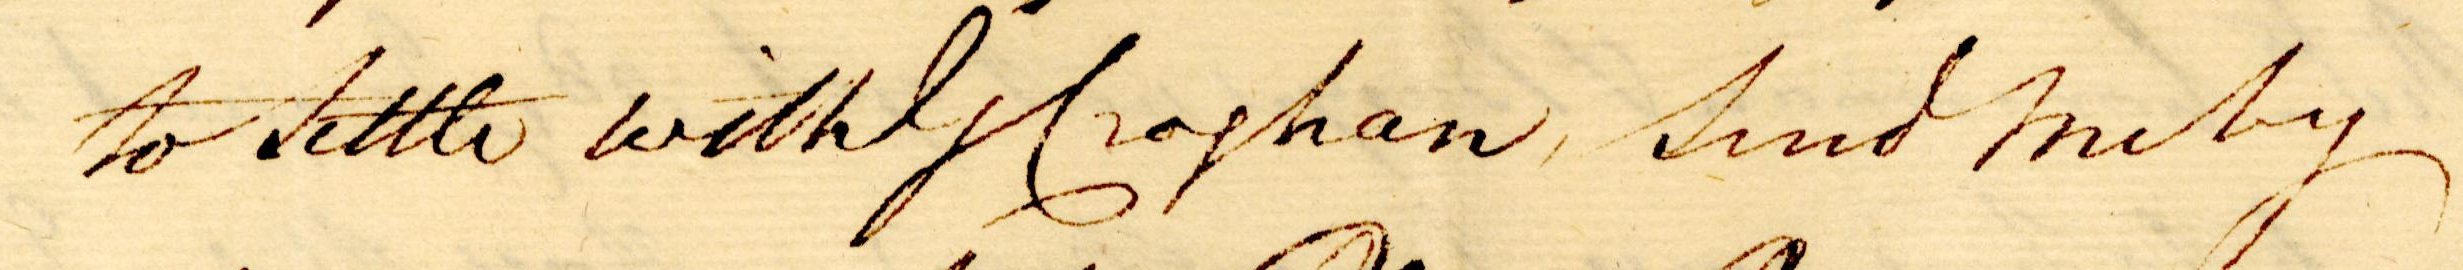to settle with Croghan, send me by
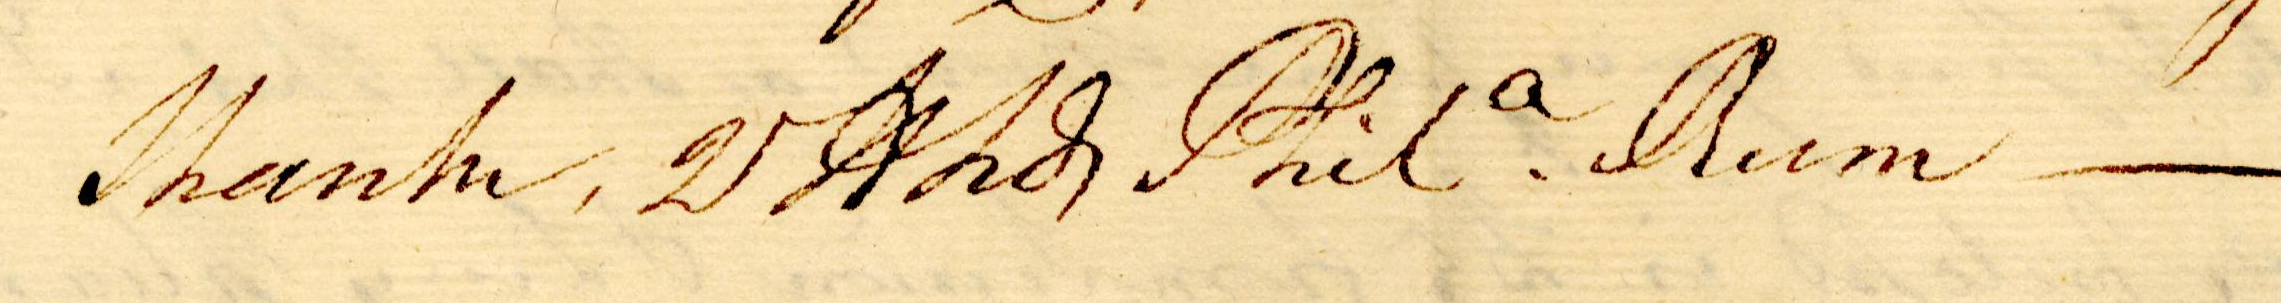Shank, 2 Hhds Phil^a. Rum-
